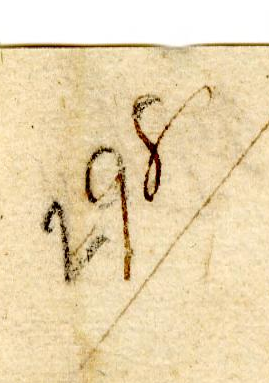298
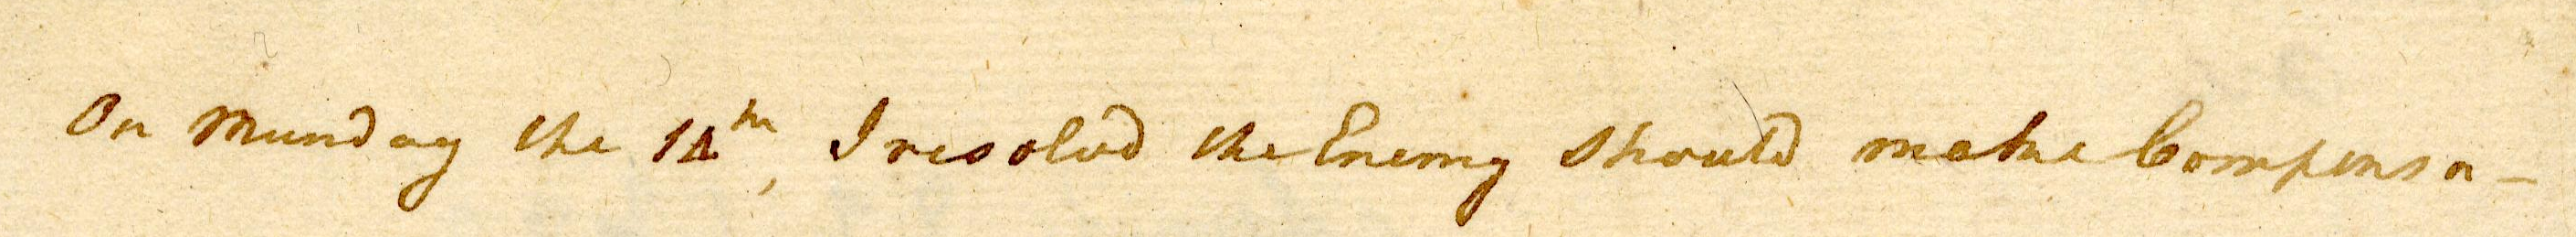On Monday the 14^th. I resolvd the Enemy should make Compensa-
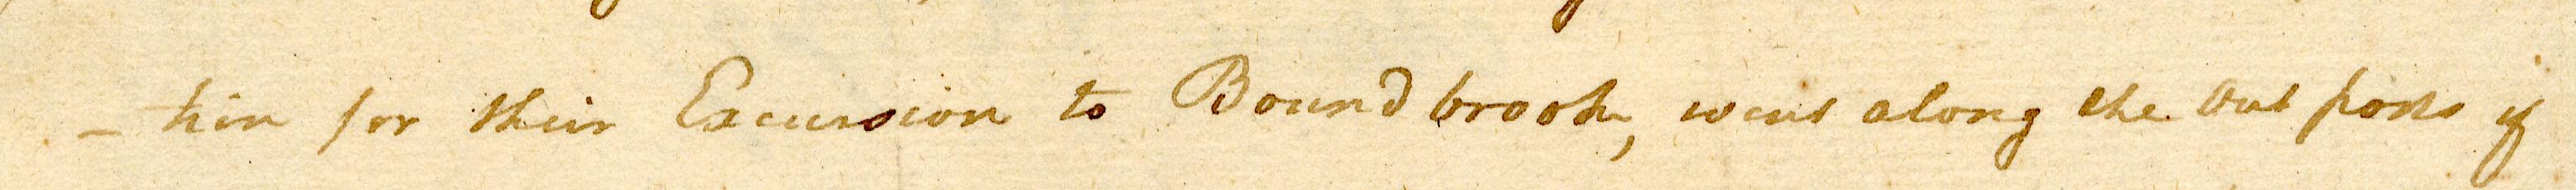-tion for their Excursion to Bound brook, went along the but poney
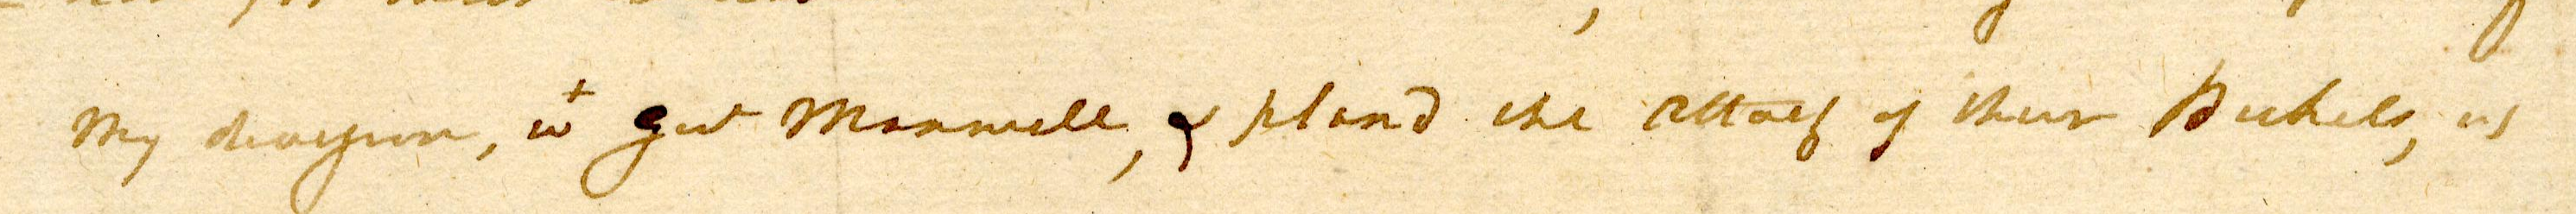My daughter, is w^t Maxwell, & pland the affair of their Buckels, us
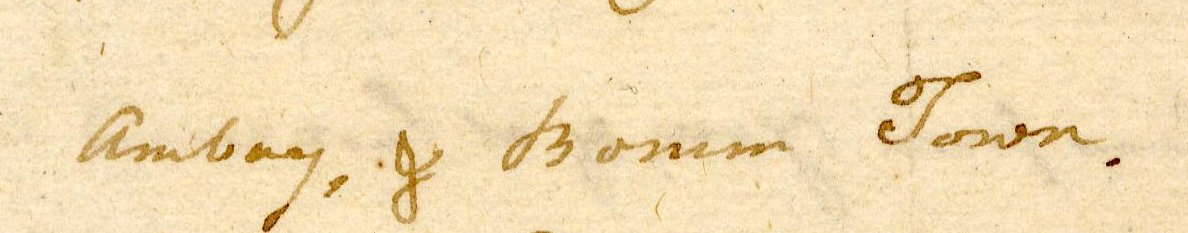Ambay, & Bowen Town.
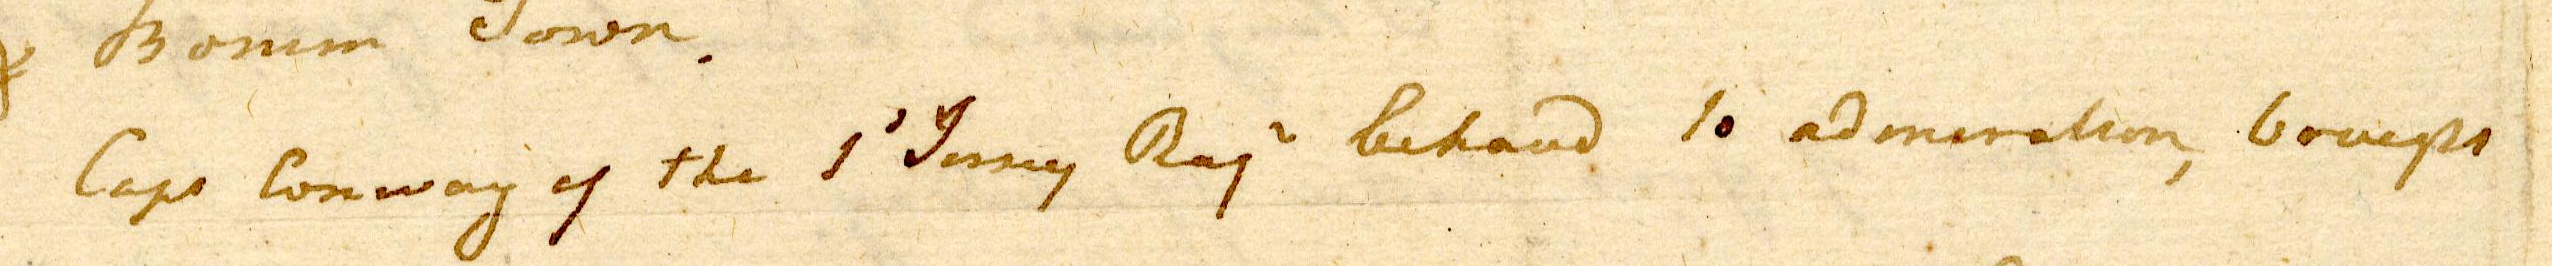Caps Conway of the 1s Army Reg^t. behavd to admiration, broke
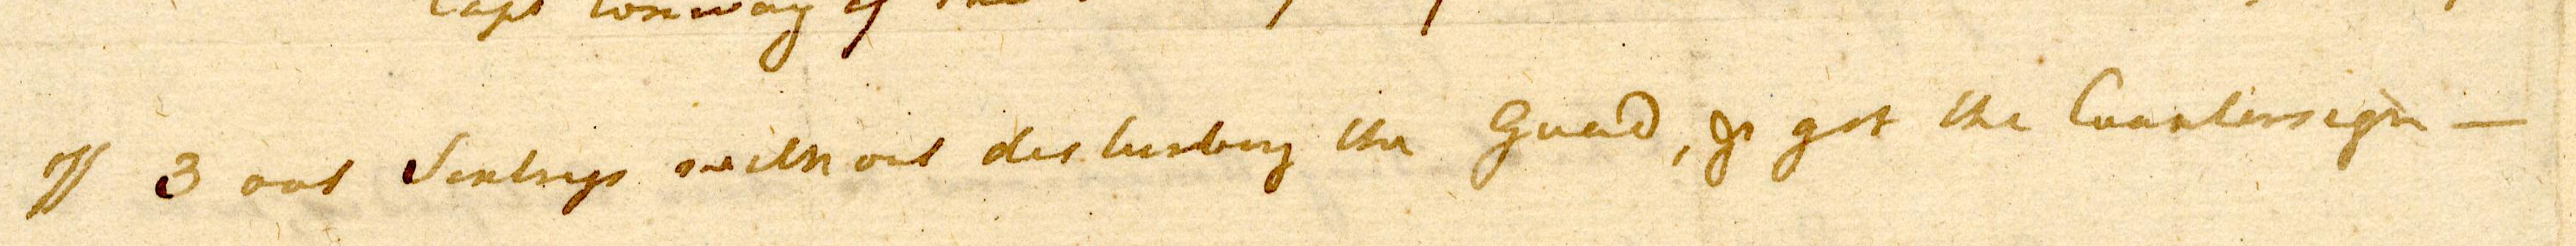of 3 out Sentrys with not disturbing the guard, & got the Cavington.-
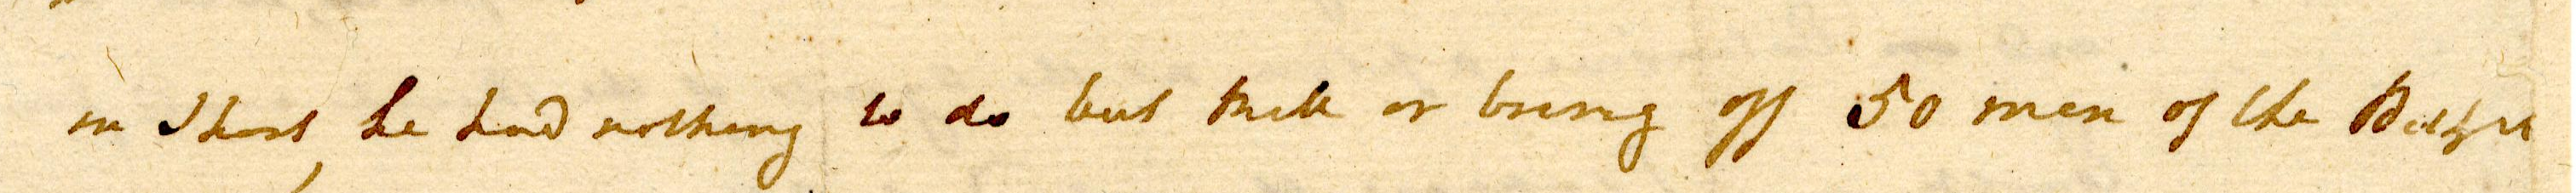in short he had nothing to do but kill or bring off 50 men of the Rest
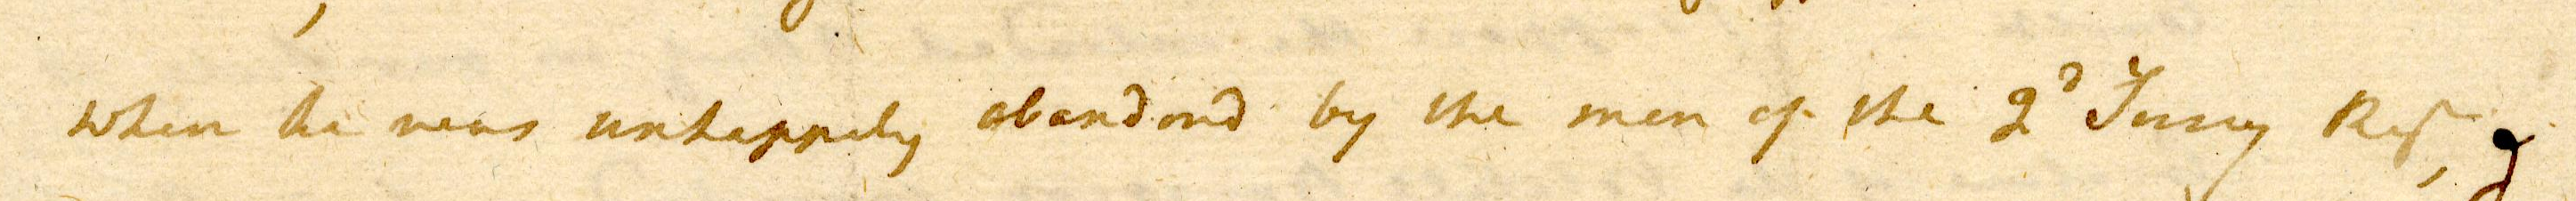when he was unhappily abandond by the men of the 2^d Army Reg,
